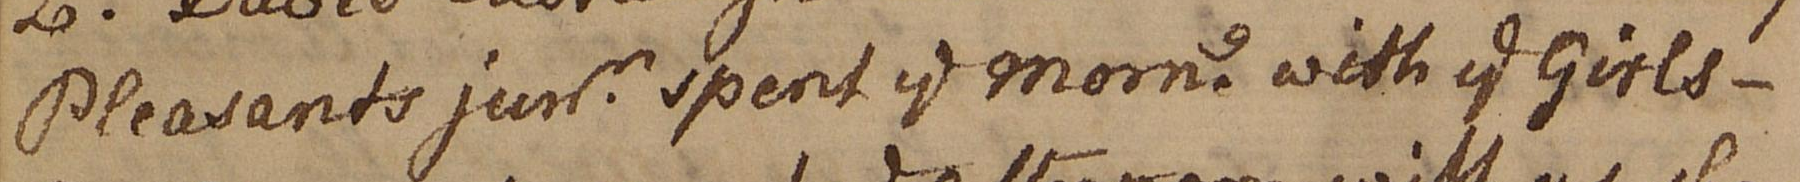Pleasants jun^r. spent y^e morn^g. with y^e Girls-
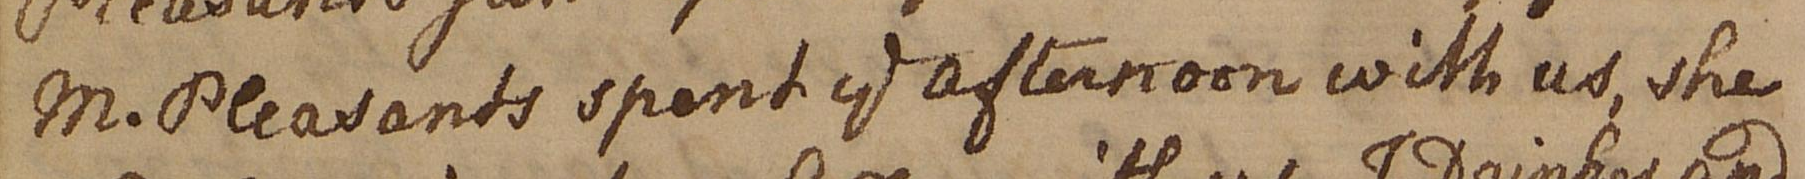M. Pleasants spent y^e afternoon with us, she
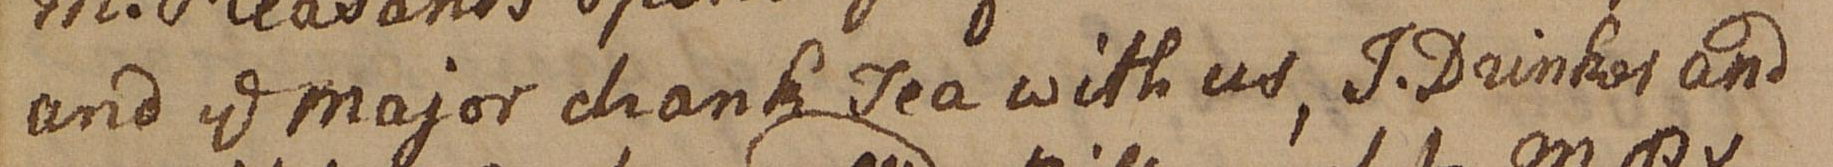and y^e major drank Tea with us, J. Drinker and
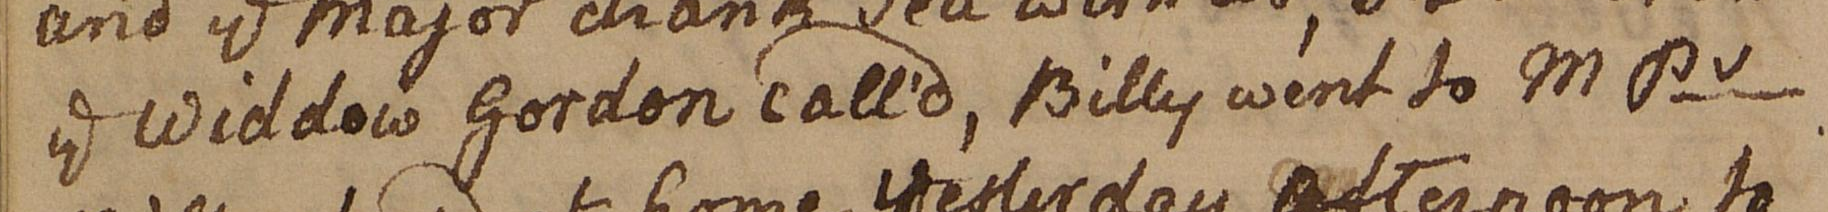y^e Widdow Gordon call'd, Billy went to M P^s-
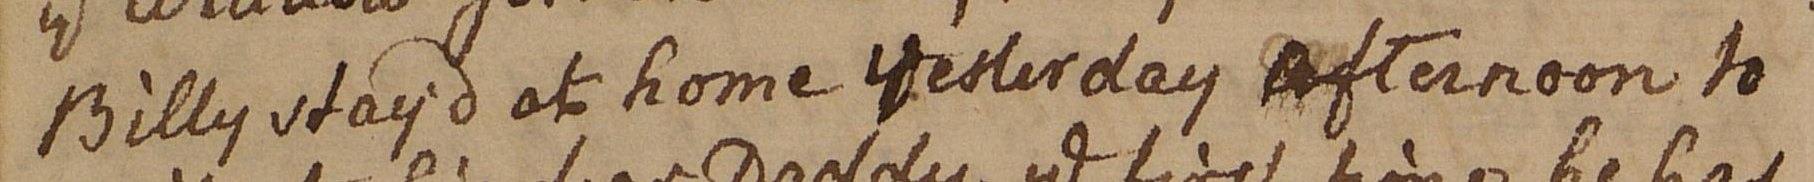Billy stay'd at home Yesterday afternoon to
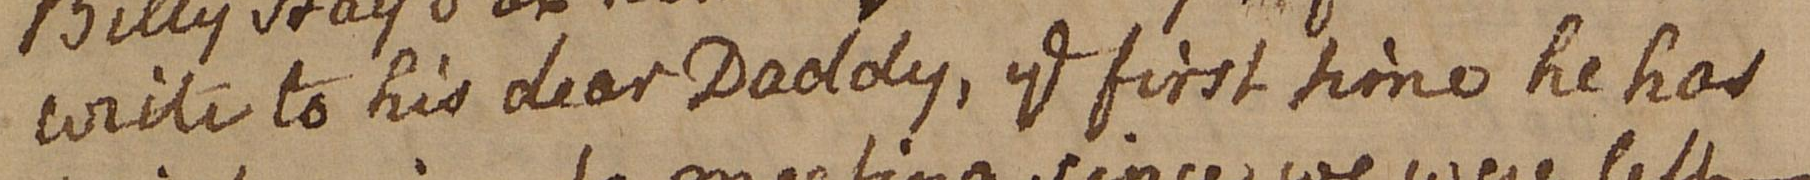write to his dear Daddy, y^e first time he has
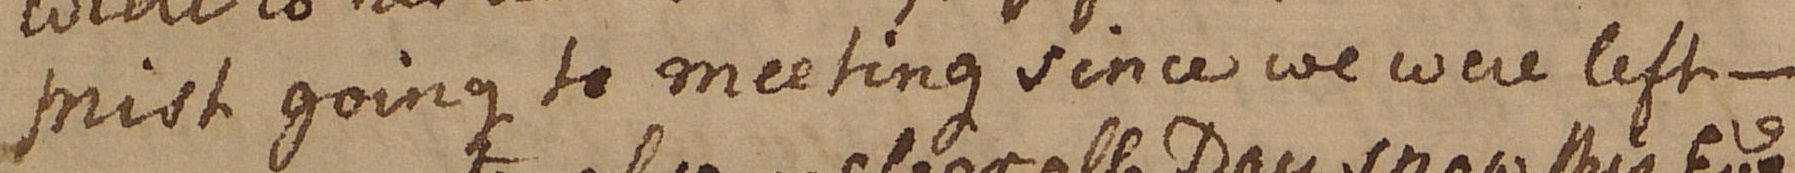mist going to meeting since we were left-
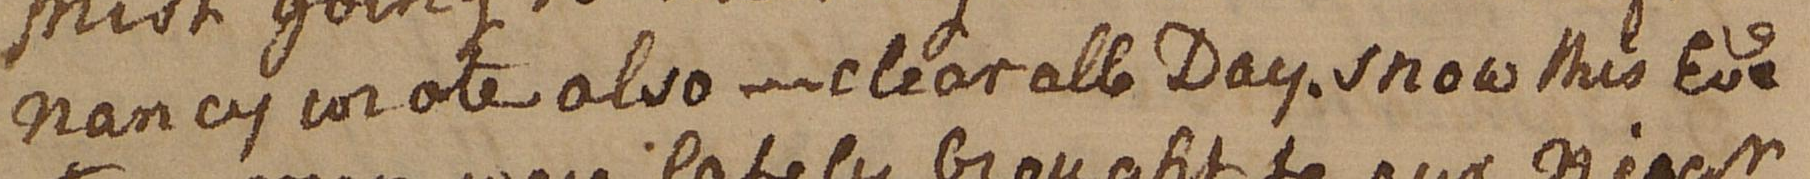Nancy wrote also- clear all Day. snow this Eve^g
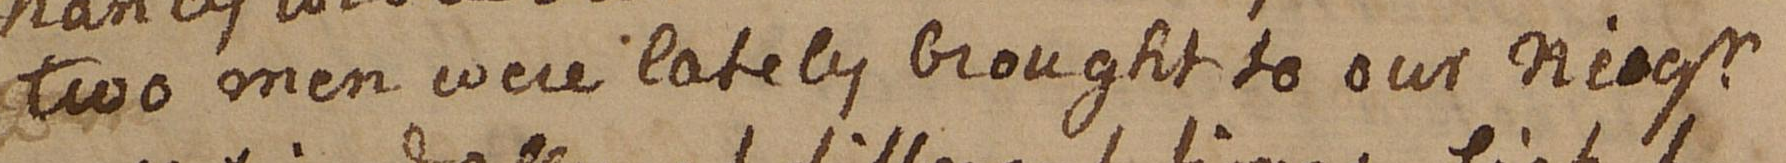two men were lately brought to our Nieg^r.
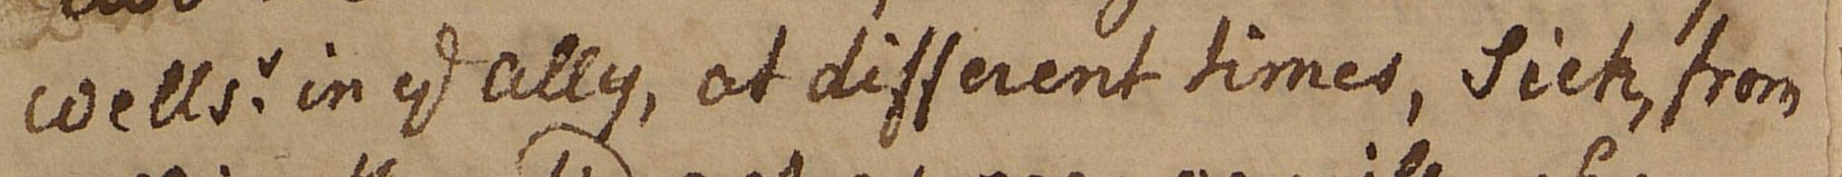Wells^s. in y^e Ally, at different times, Sick, from
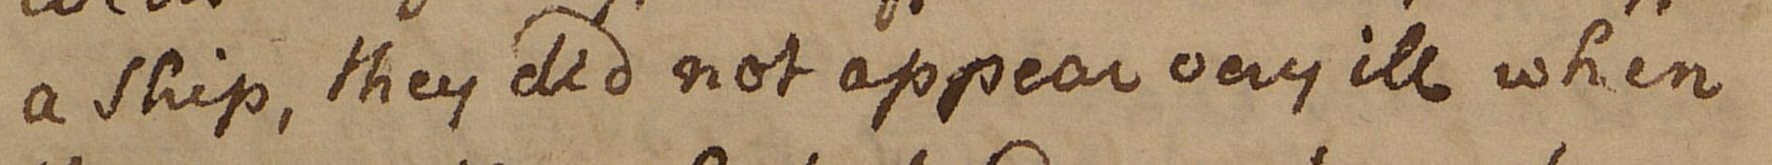a Ship, they did not appear very ill when
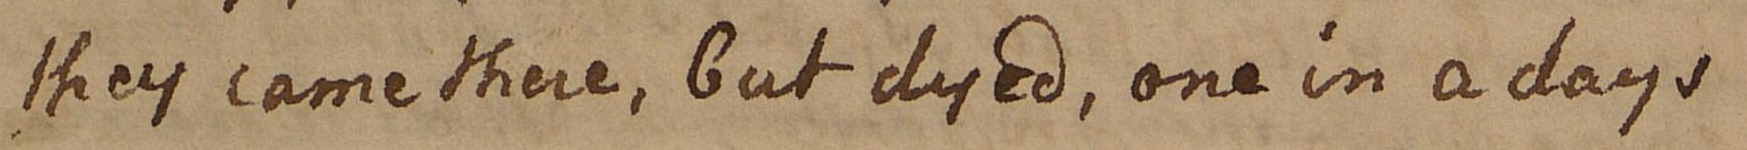they came there, but dyed, one in a days
